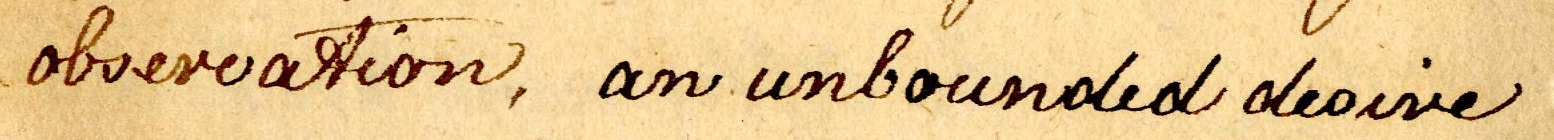observation, an unbounded desire
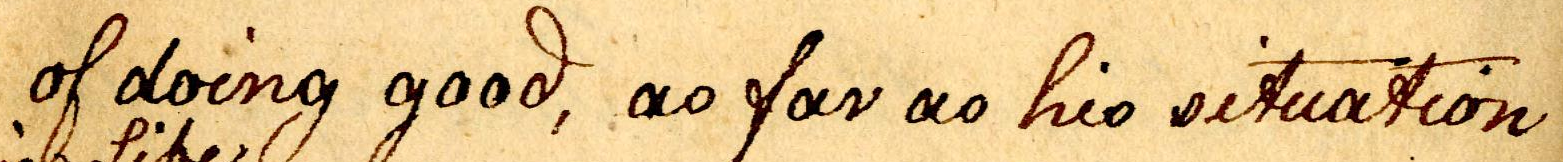of doing good, as far as his situation
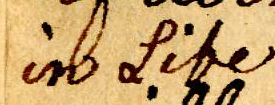in Life
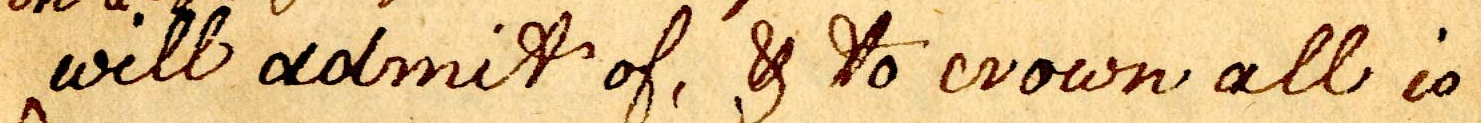^ will admit of, & to crown all is
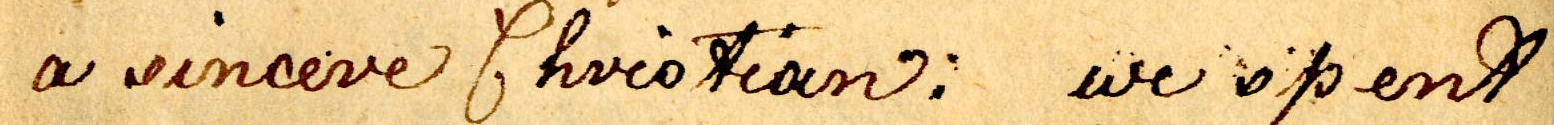a sincere Christian. we spent
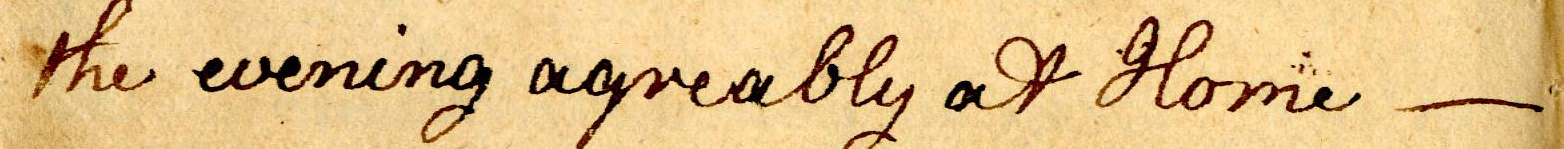the evening agreably at Home -
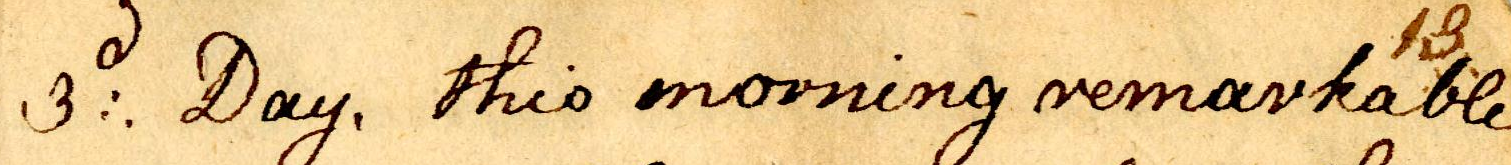3^d. Day, this morning remarkable
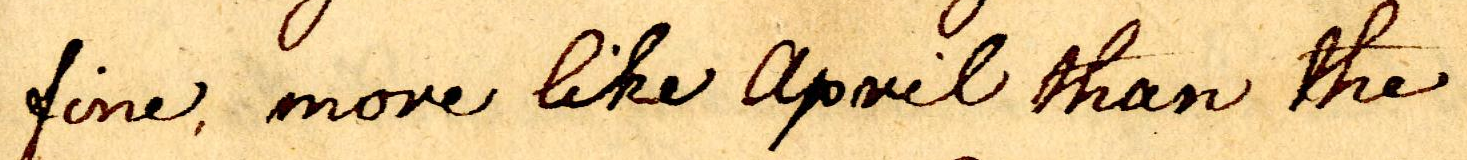fine, more like April than the
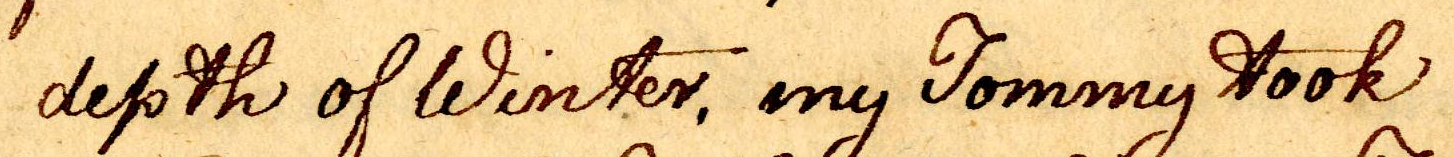depth of Winter, my Tommy took
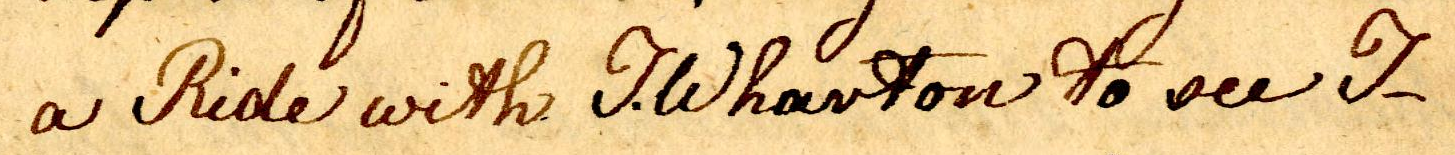a Ride with T. Wharton to see T-
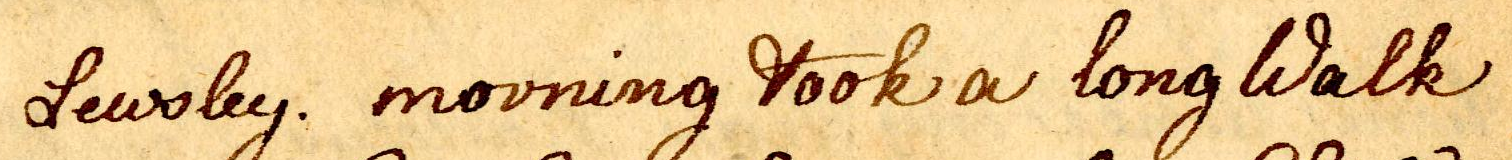Lewsley. morning took a long Walk
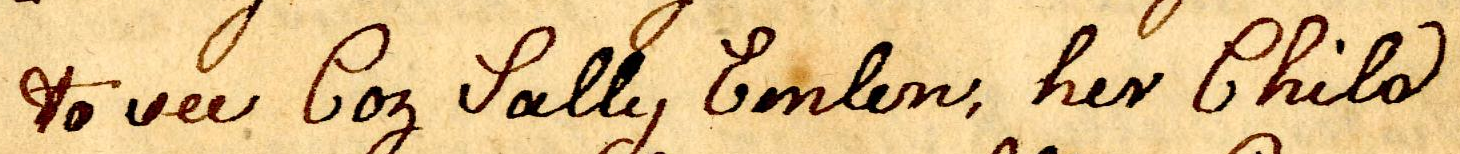to see Coz Sally Emlen, her Child
